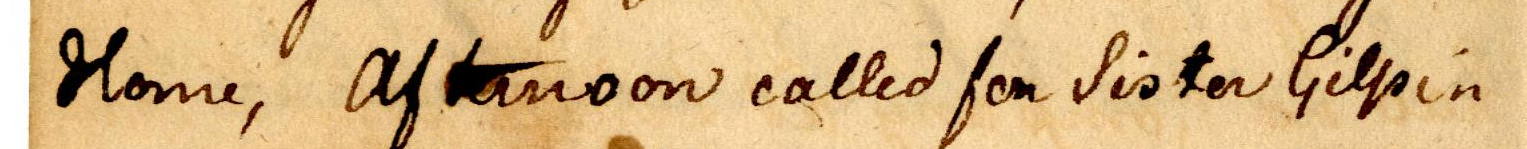Home, Afternoon called for Sister Gilpin
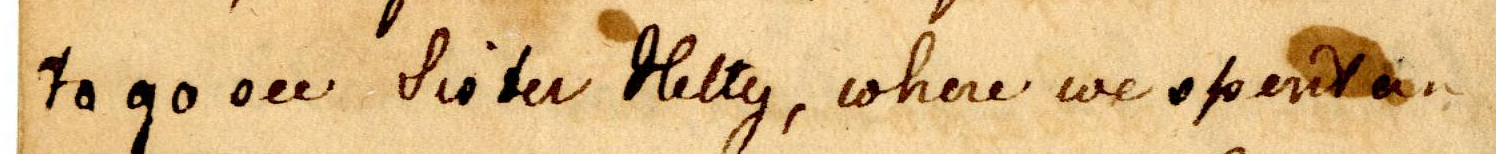to go see Sister Hetty, where we spent an
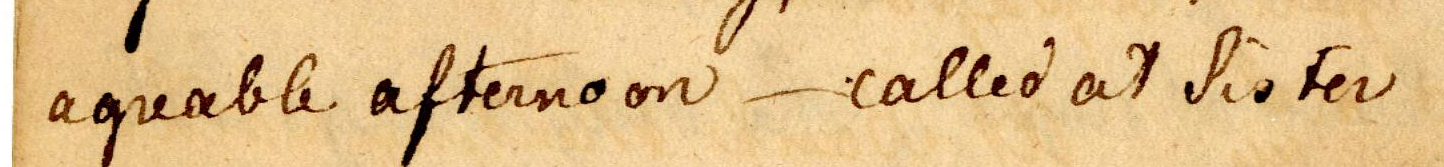agreable afternoon- called at Sister
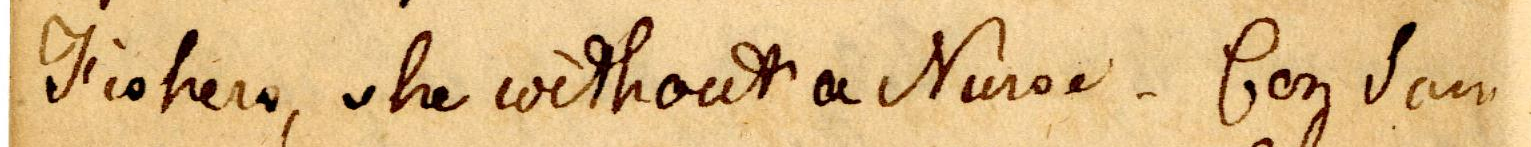Fishers, she without a Nurse- Coz Sam
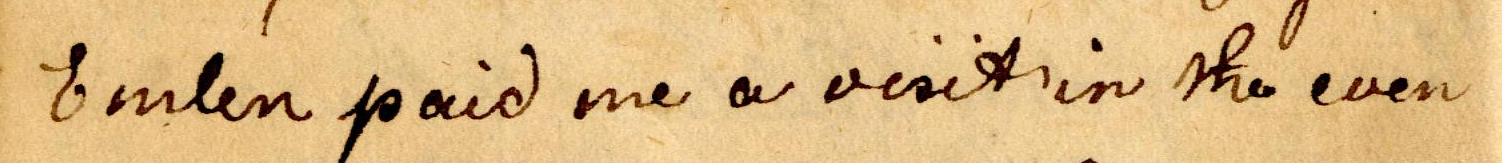Emlen paid me a visit in the even
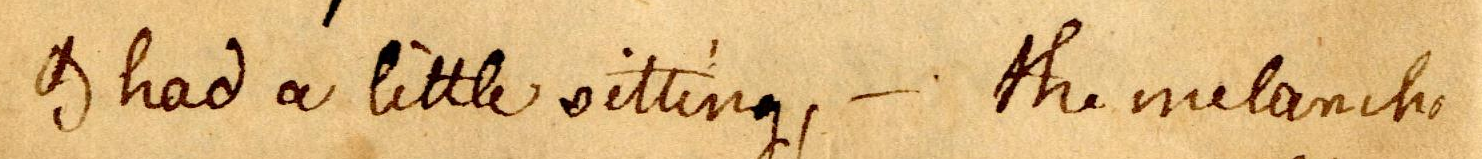& had a little sitting,- the melanchol
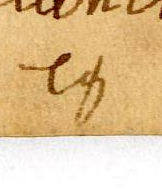ly
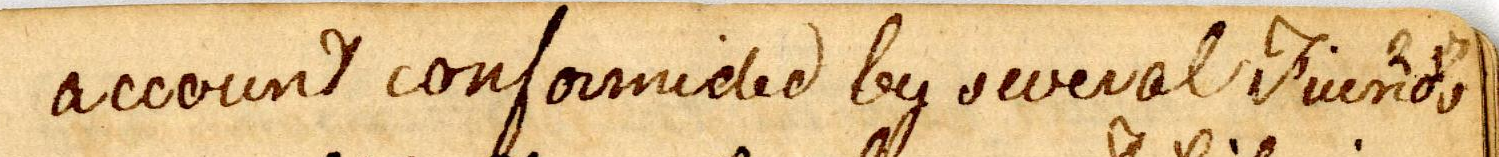account conformided by several Friends
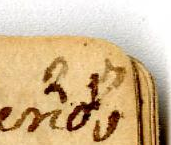27
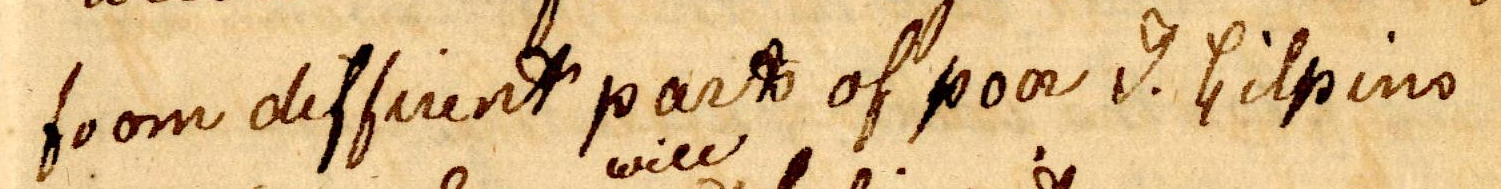from different parts of poor T. Gilpins
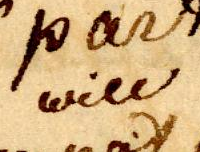will
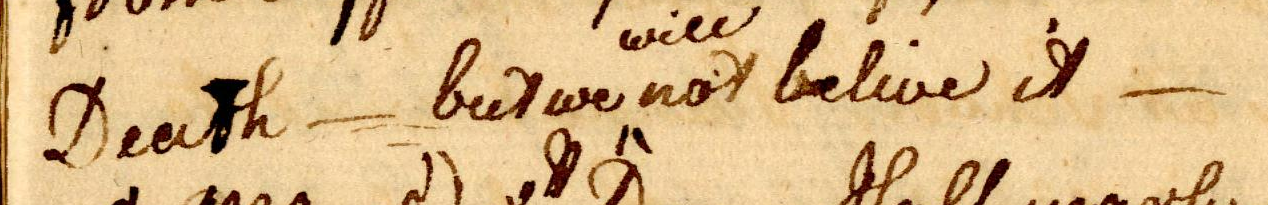Death- but we ^ not belive it-
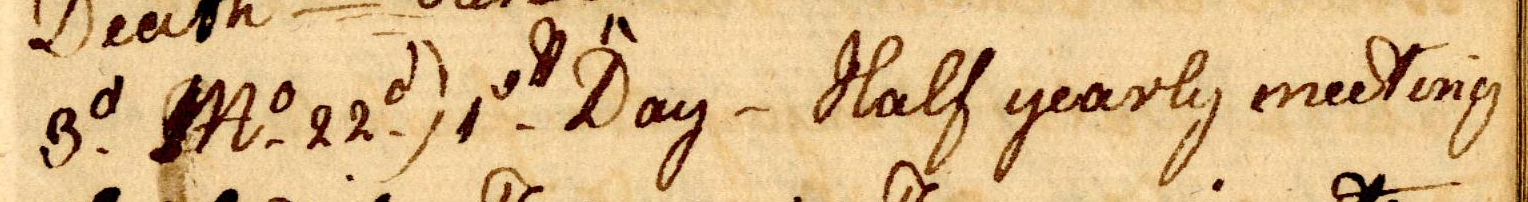3^d. M^o 22^d) 1^st Day- Half yearly meeting
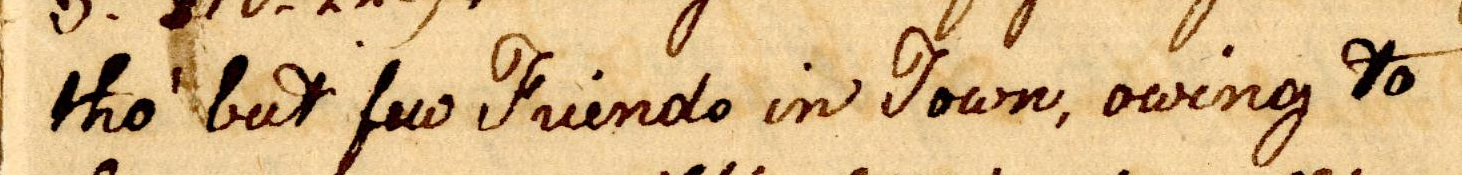tho' but few Friends in Town, owing to
